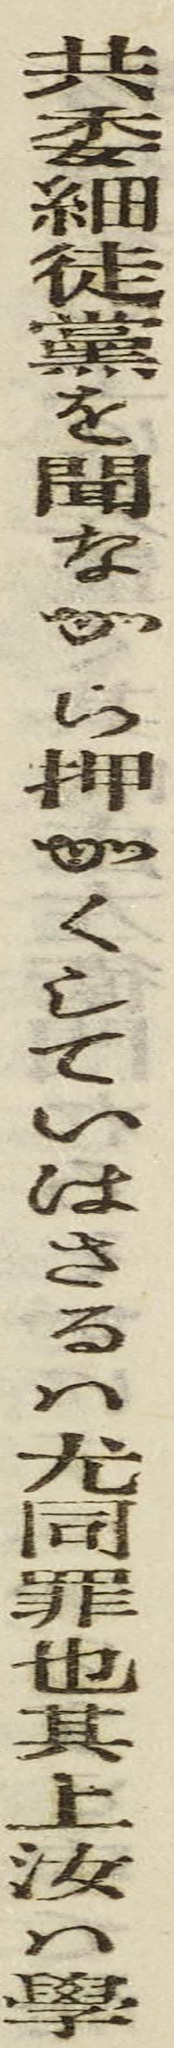共委細徒党を聞なから押かくしていはさるは尤同罪也其上汝は学
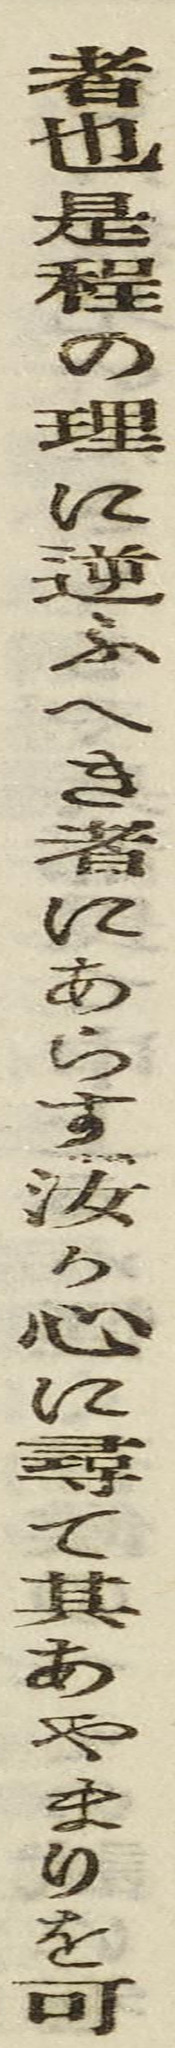者也是程の理に逆ふへき者にあらす汝か心に尋て其あやまりを可
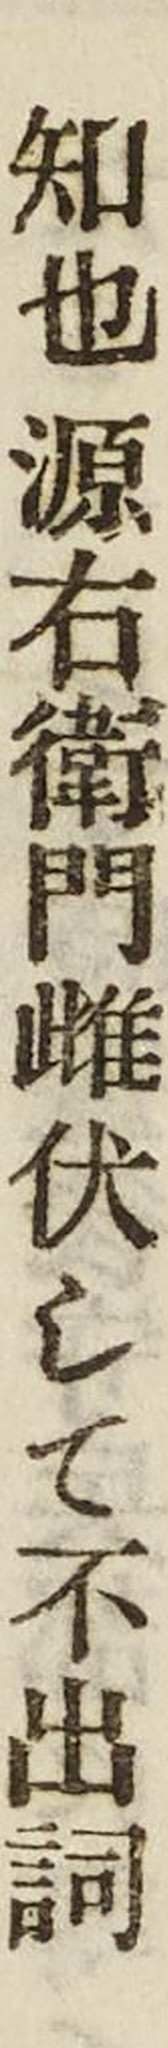知也源右衛門雌伏して不出詞
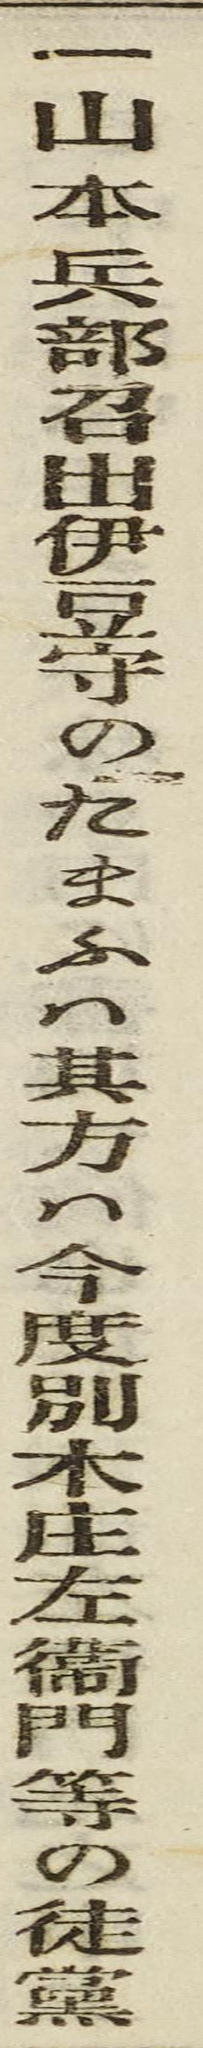一山本兵部召出伊豆守のたまふは其方は今度別木庄左衞門等の徒党
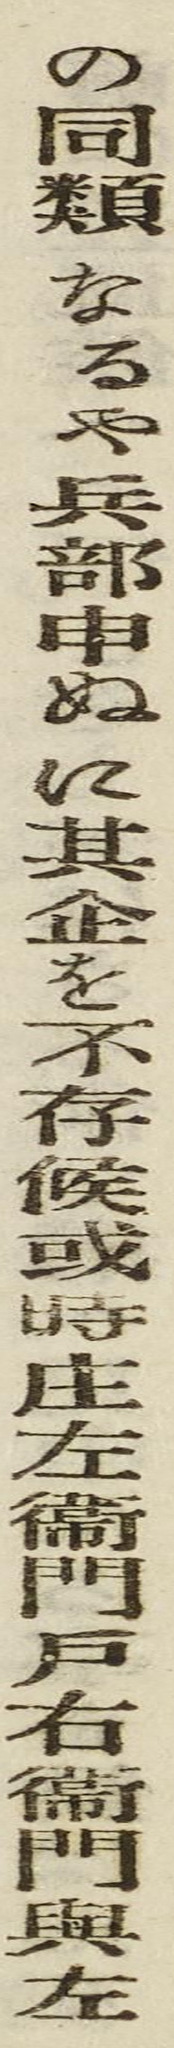の同類なるや兵部申ぬに其企を不存候或時庄左衞門戸右衞門与左
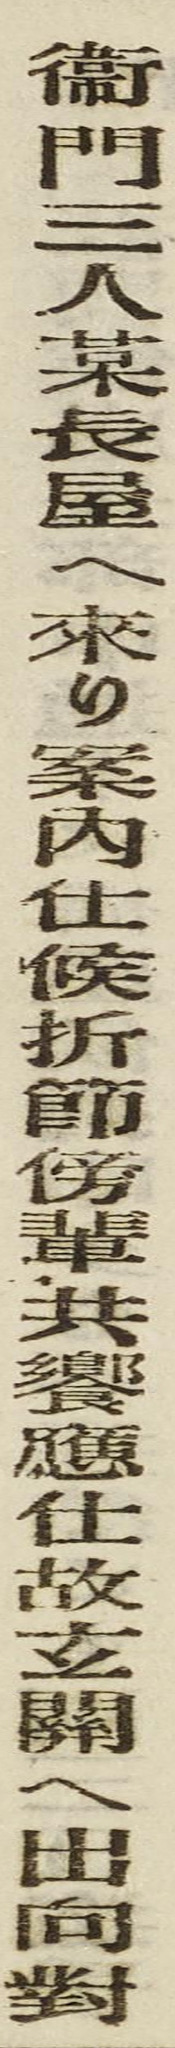衞門三人某長屋へ来り案内仕候折節傍輩共饗応仕故玄関へ出向対
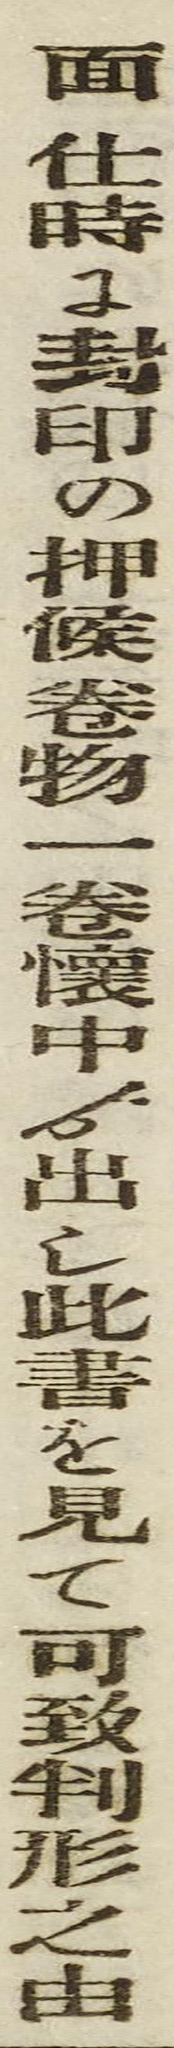面仕時に封印の押候巻物一巻懐中ゟ出し此書を見て可致判形之由
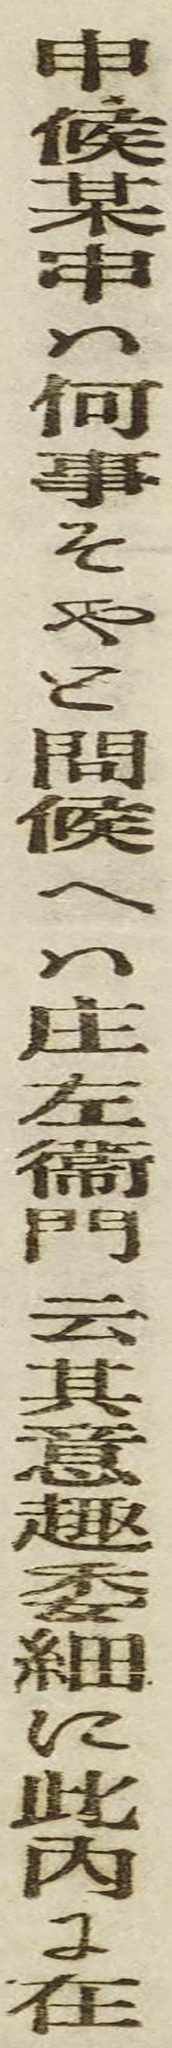申候某申は何事そやと問候へは庄左衞門云其意趣委細に此内に在
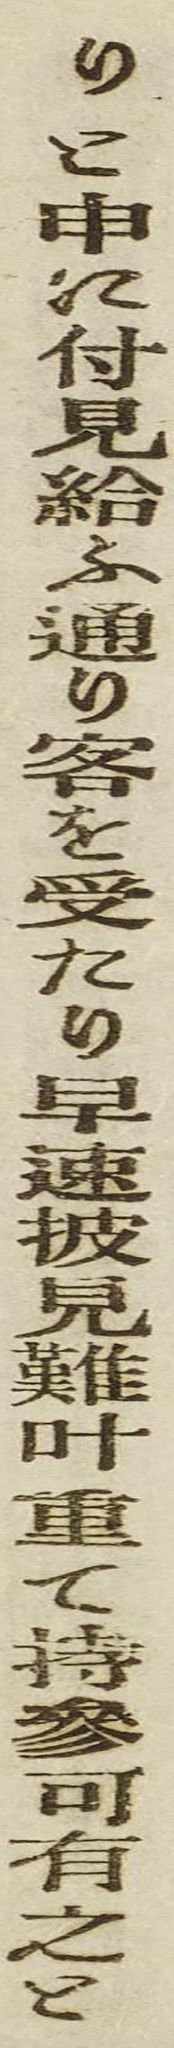りと申に付見給ふ通り客を受たり早速披見難叶重て持参可有之と
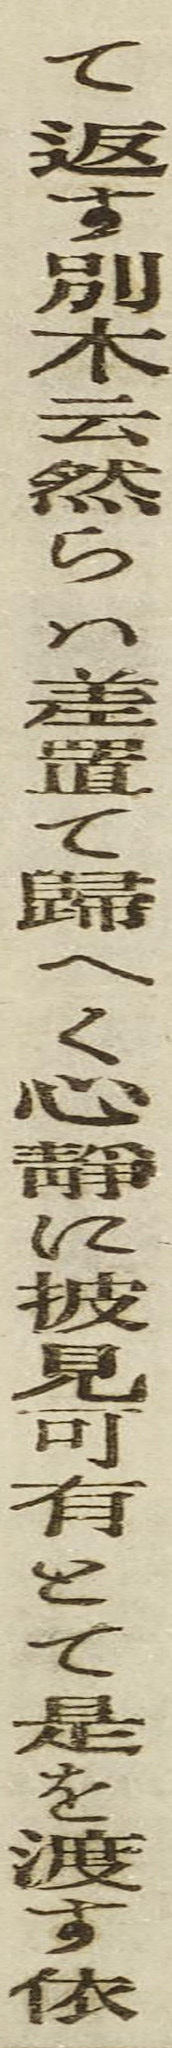て返す別木云然らは差置て帰へく心静に披見可有とて是を渡す依

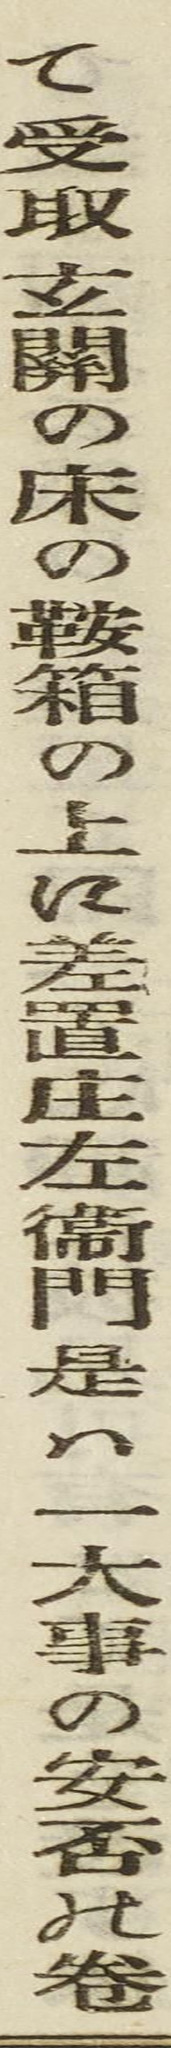て受取玄関の床の鞍箱の上に差置庄左衞門是は一大事の安否の巻
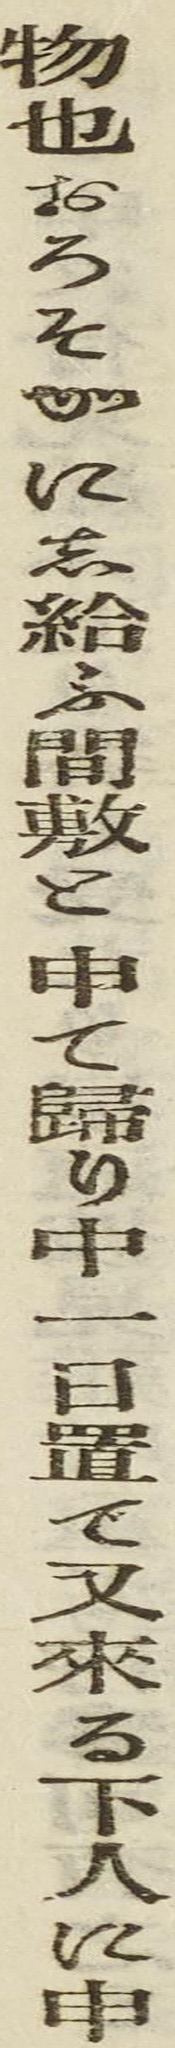物也おろそかにし給ふ間敷と申て帰り中一日置て又来る下人に申
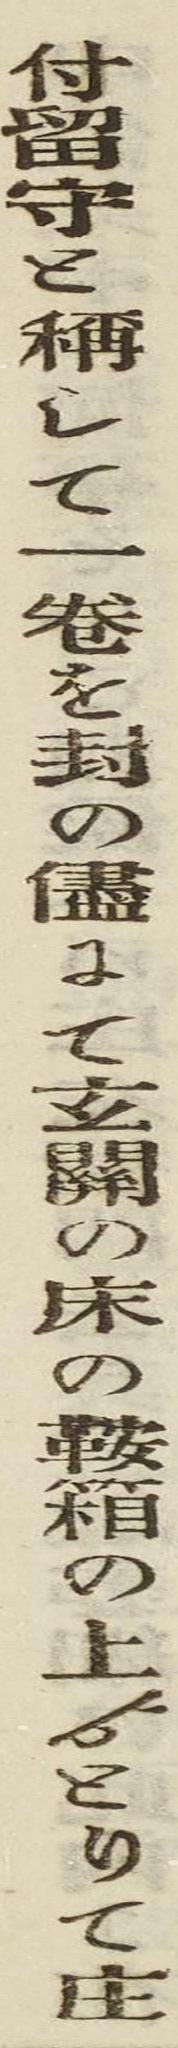付留守と称して一巻を封の侭にて玄関の床の鞍箱の上ゟとりて庄
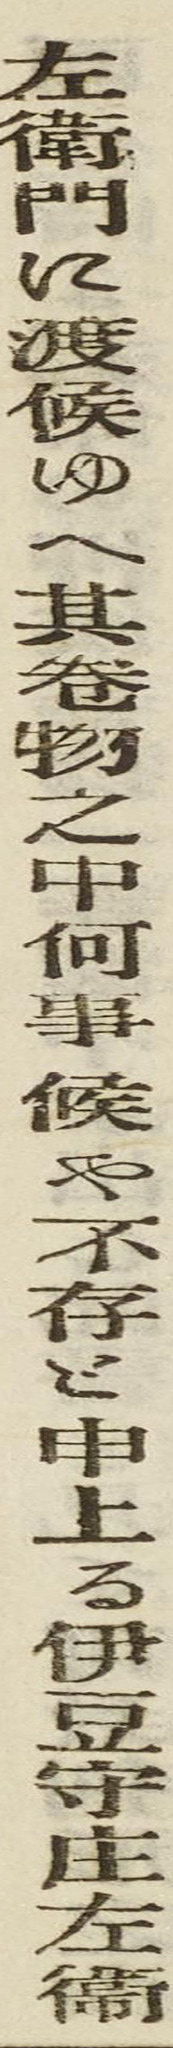左衛門に渡候ゆへ其巻物之中何事候や不存と申上る伊豆守庄左衞
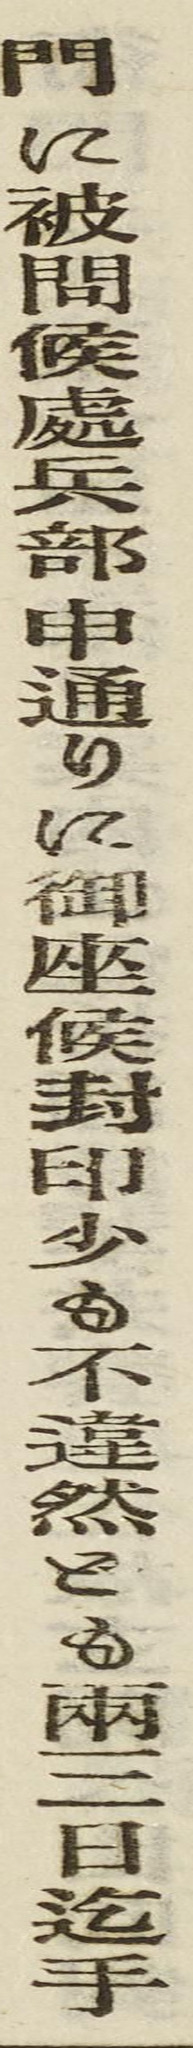門に被問候処兵部申通りに御座候封印少も不違然とも両三日迄手
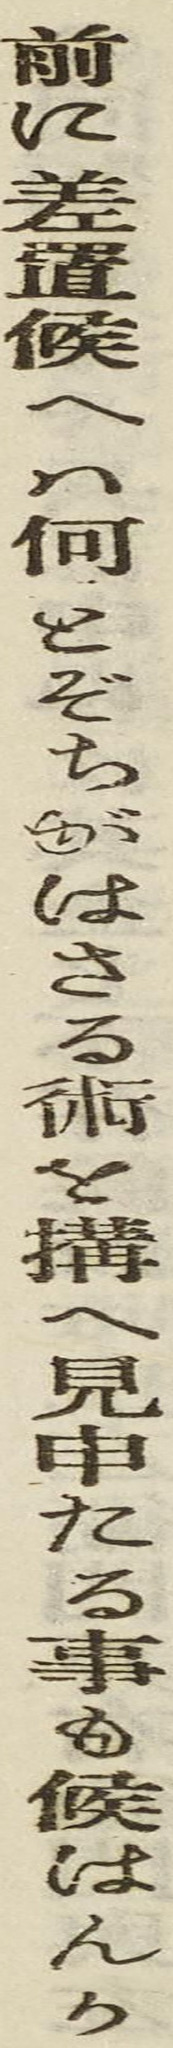前に差置候へは何とぞちがはさる術を搆へ見申たる事も候はんか
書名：史籍集覽　朝鮮陣古文・細井廣澤記・颶風紀事・天明七年將軍宣下次第書　全
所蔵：東京大学地震研究所図書室 Earthquake Research Institute Library, The University of Tokyo, JAPAN
